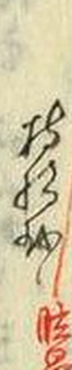持指越候
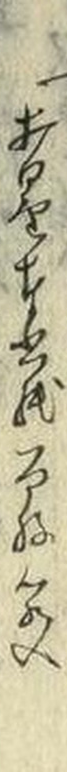打曇奉書紙百枚箱入
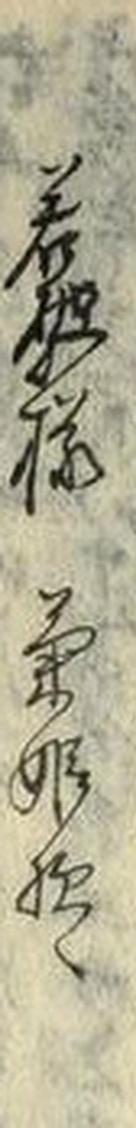若殿様菊姫様へ
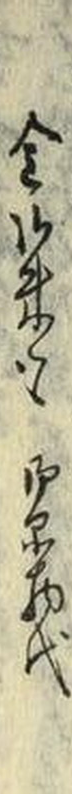金弐朱ツヽ御品物代
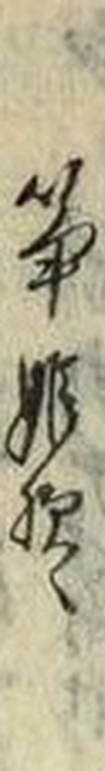箏姫様へ

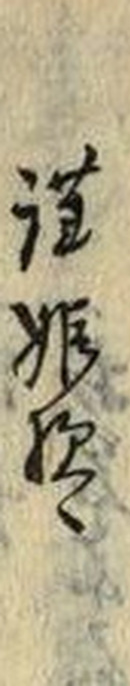謹姫様へ
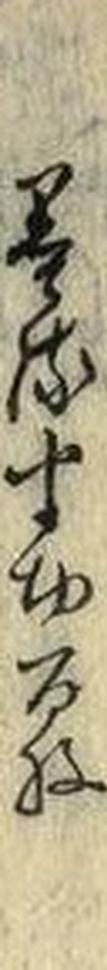墨流半切百枚
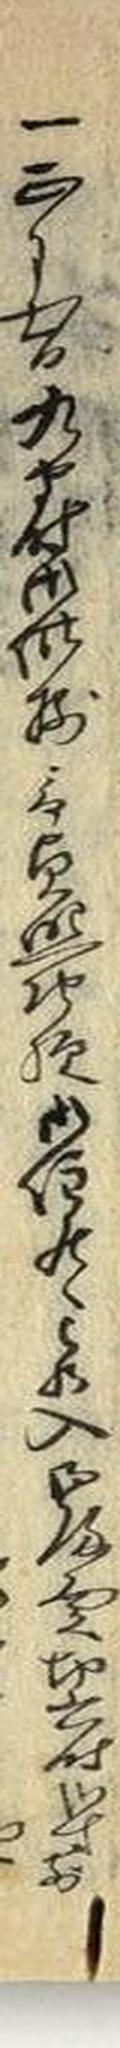一正月五日九半時御供揃ニ而貞照院様御住居へ被為入御帰殿切六時弐寸前
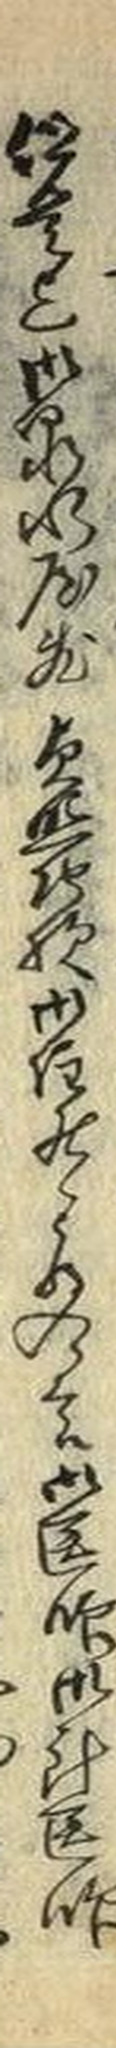但是迄御泉水屋敷貞照院様御住居へ被為入候節御医師御針医師
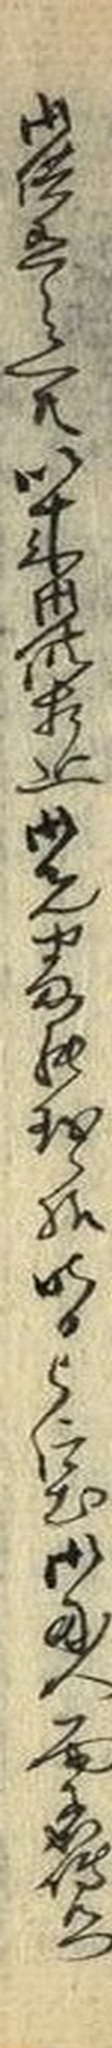御供有之候へ共以来御供打止御先番罷越候様昨日被仰出御用人雨森伝左衛門
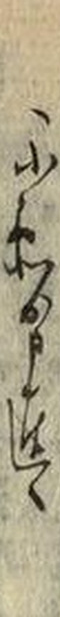へ小兵衛ゟ申達候
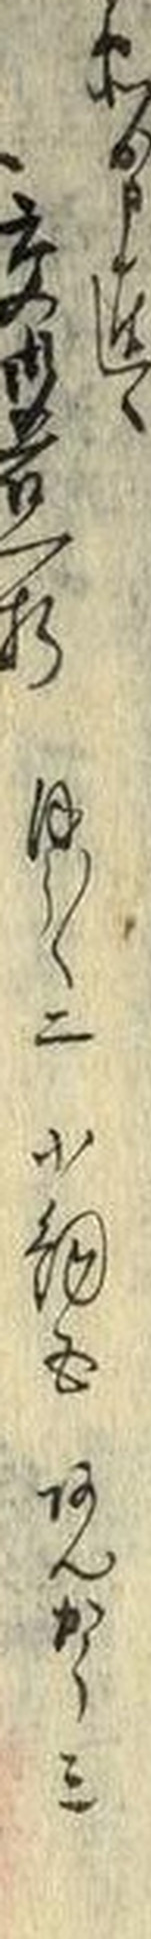交御肴一折ほう〳〵二小鯛五あんかう三
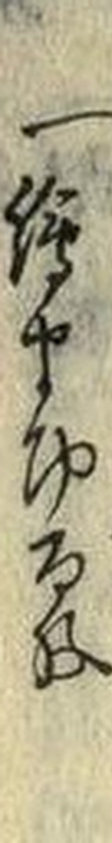絵半切百枚
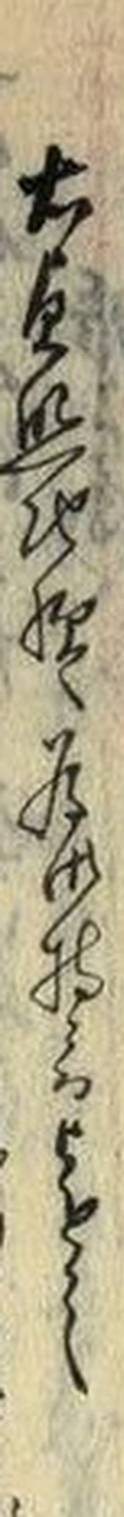右貞照院様へ為御持ニ而被進之
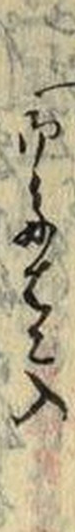御たはこ入
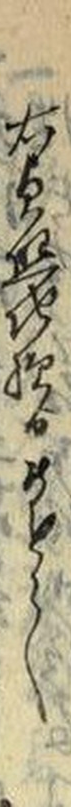右貞照院様ゟ被進之
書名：少傅日録抄（斉承付側向頭取日記、在国）
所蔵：福井県文書館 Fukui Prefectural Archives
